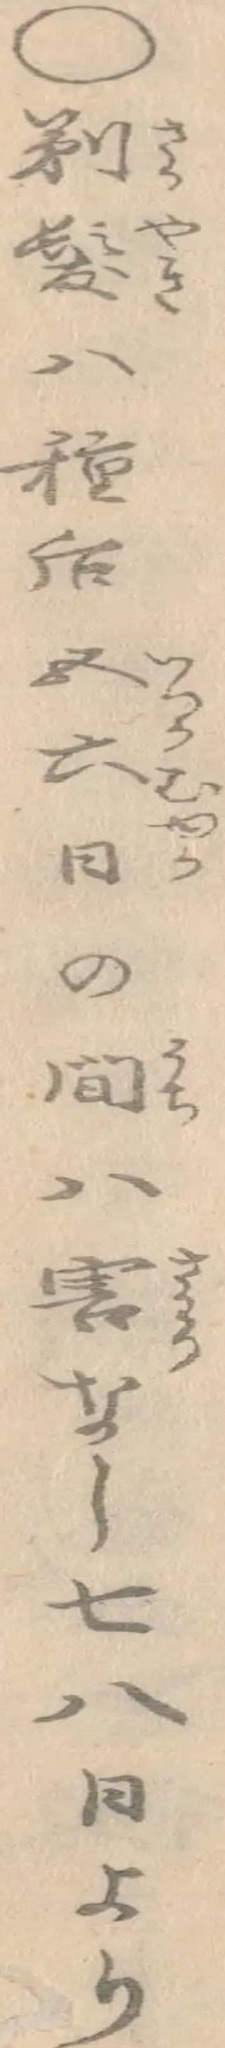○剃髪は種后五六日の間は害なし七八日より
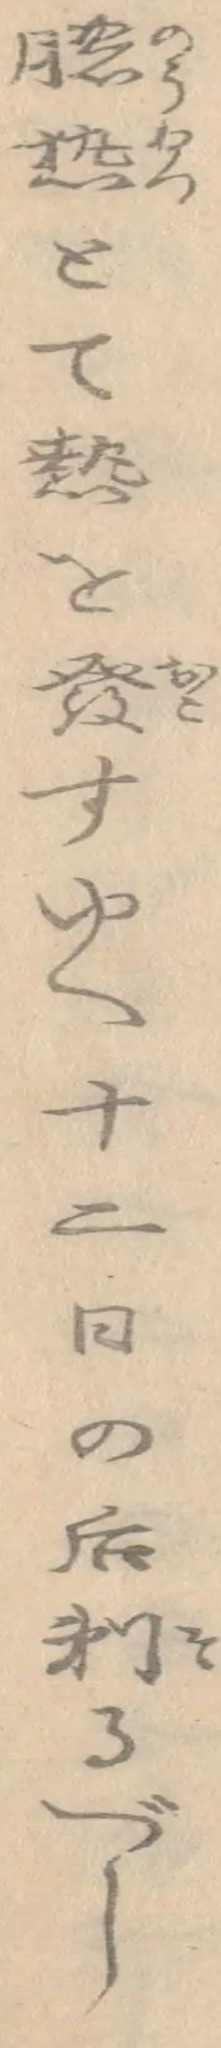濃熱とて熱を発すゆく十二日の后剃るべし

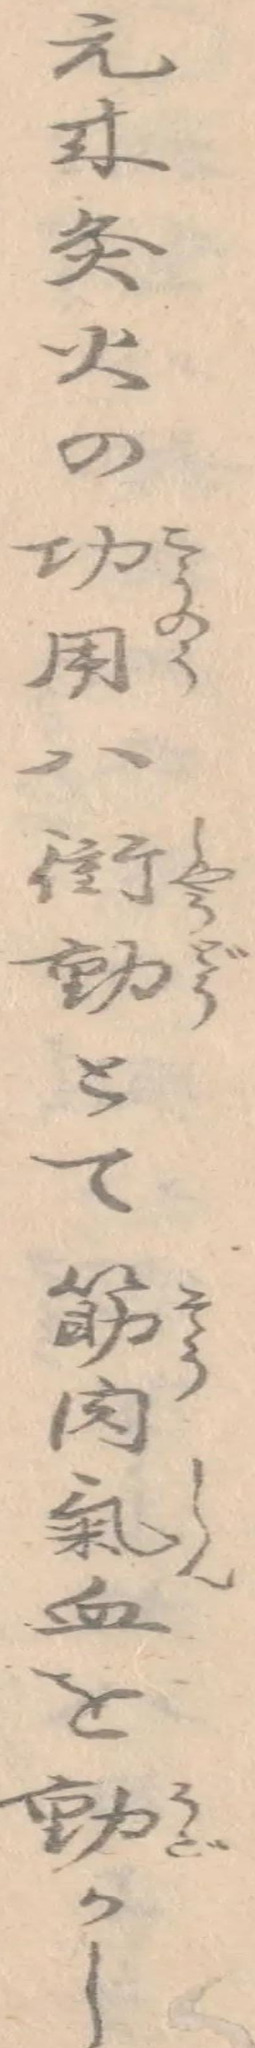元来灸火の効用は衝動とて筋肉気血を動かし
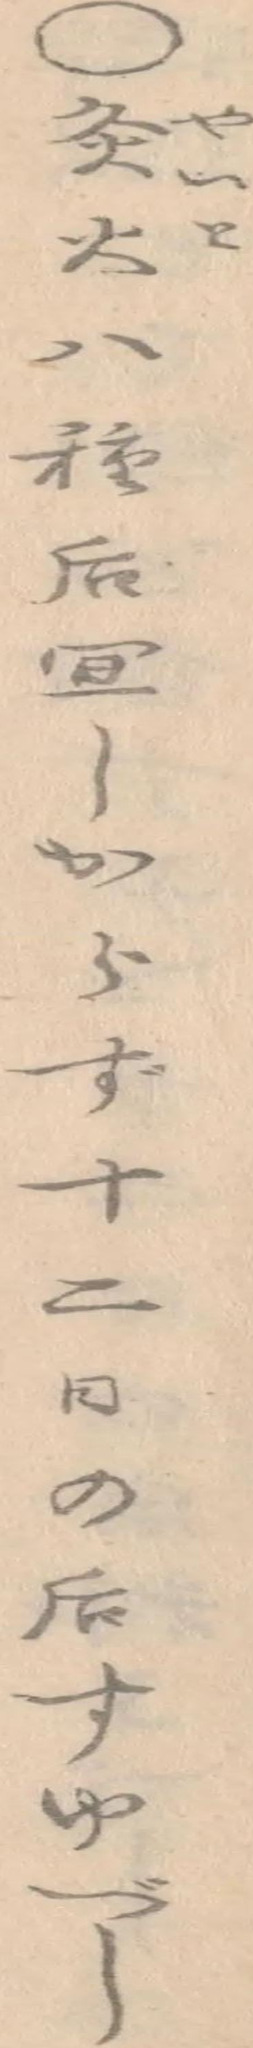○灸火は種后宜しからず十二日の后すゆべし
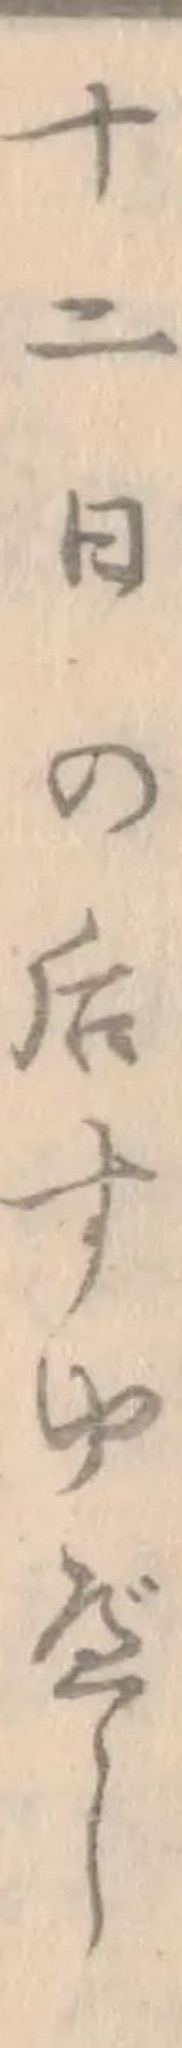十二日の后すゆべし
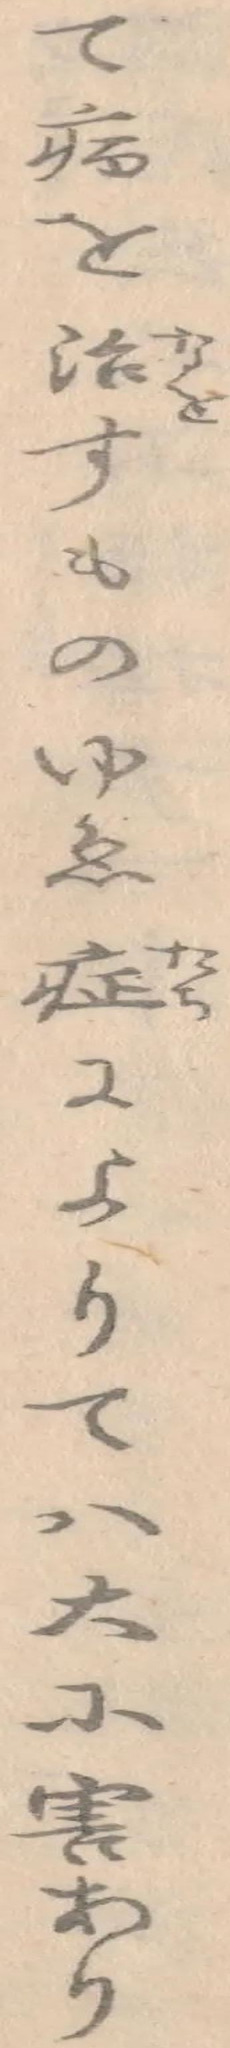て病を治すものゆゑ症によりては大小害あり
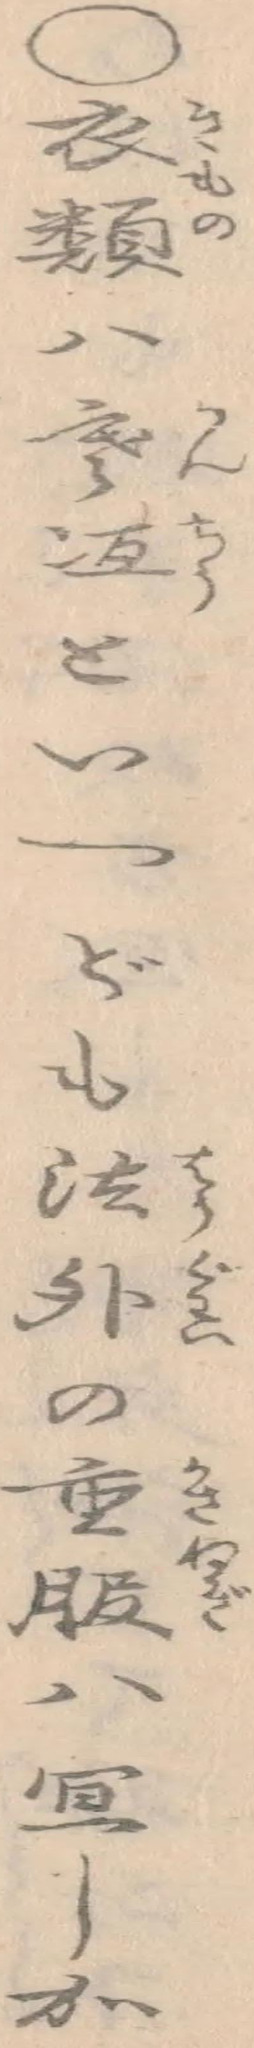○衣類は寒辺といへども法外の重服は宜しか
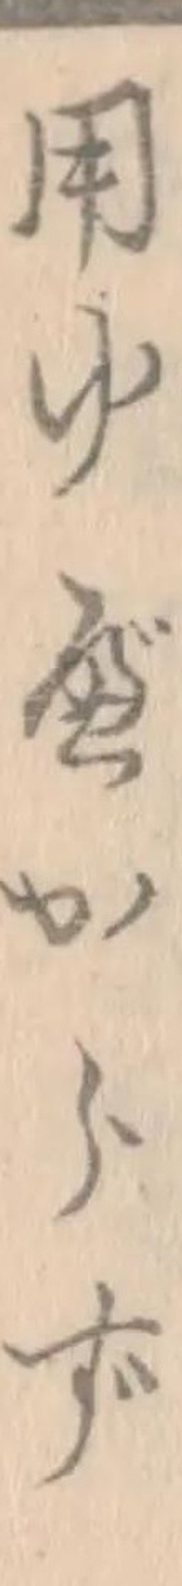用ゆべからず
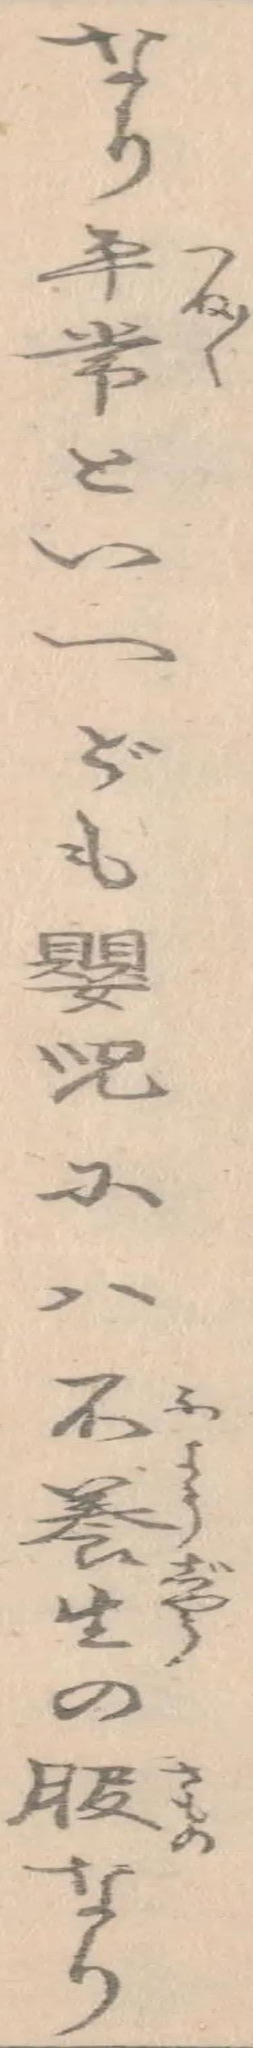なり年常といへども嬰児には不養生の服なり
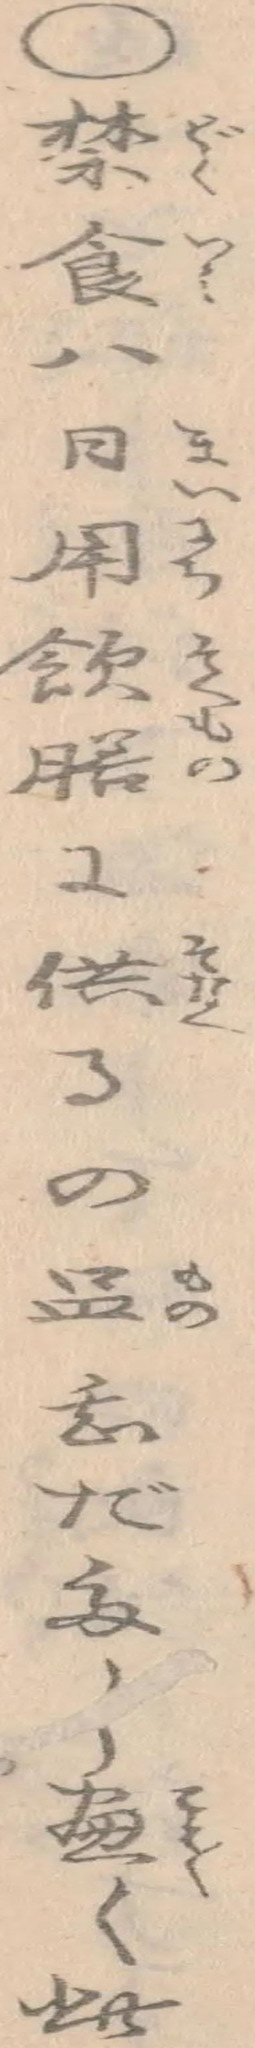○禁食は用飲膳に供るの品甚だたし盡く此
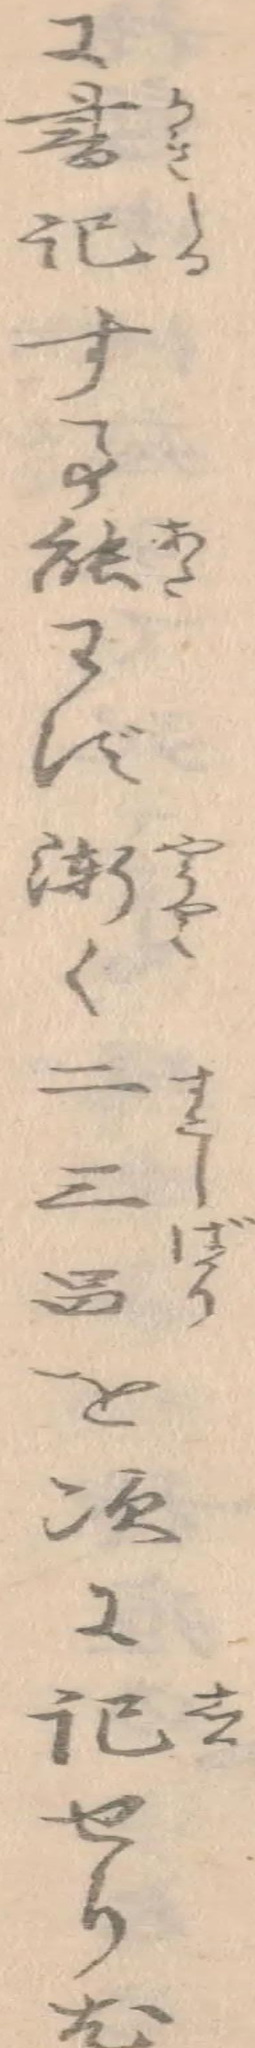に書記す事能わず漸く二三品を次に記せりは
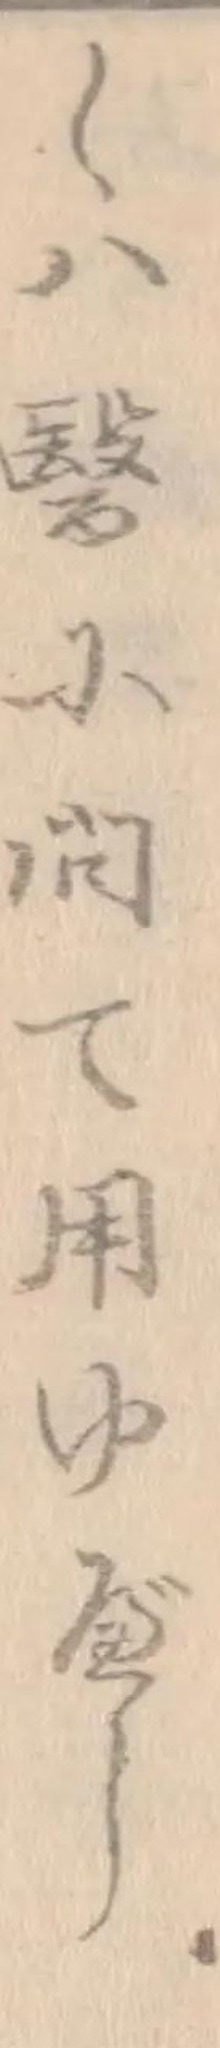くは醫に問て用ゆべし
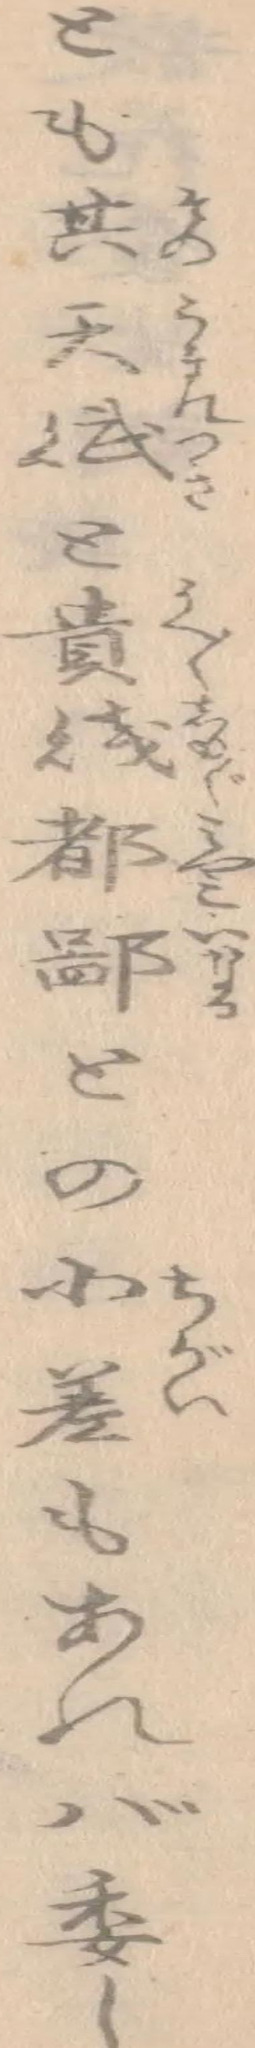とも其天賦と貴賤都鄙との少差もあれば委し
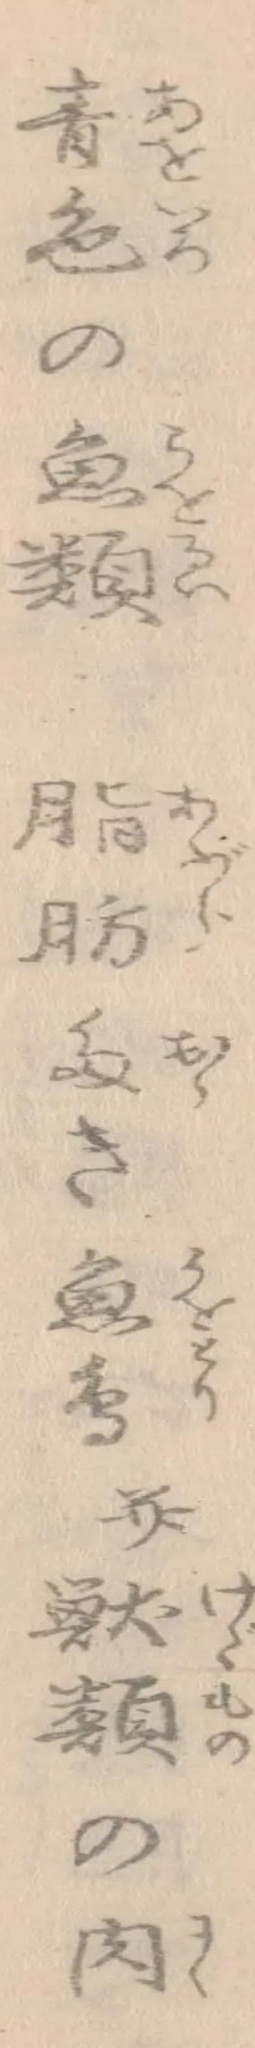青色の魚類脂肪多き魚鳥又獣類の肉
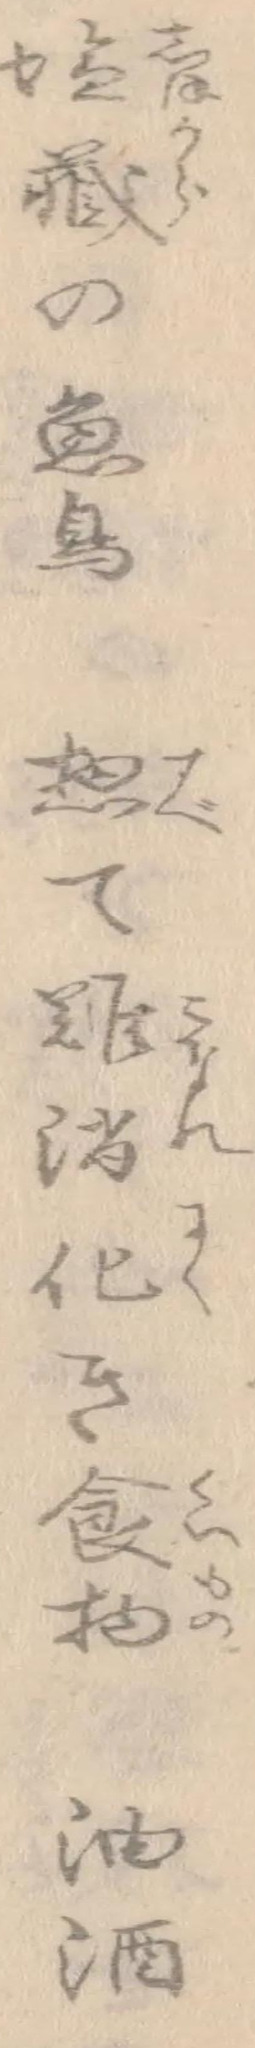塩蔵の魚鳥総て難消化き食物油酒
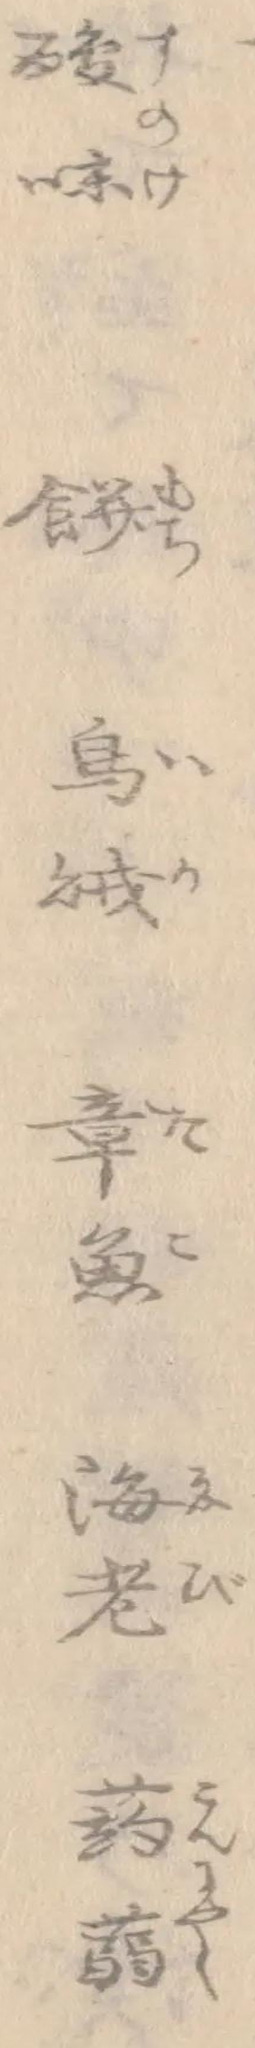酸味餅烏賊章魚海老蒟蒻
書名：散花養生訓
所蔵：国立国会図書館 National Diet Library, JAPAN
